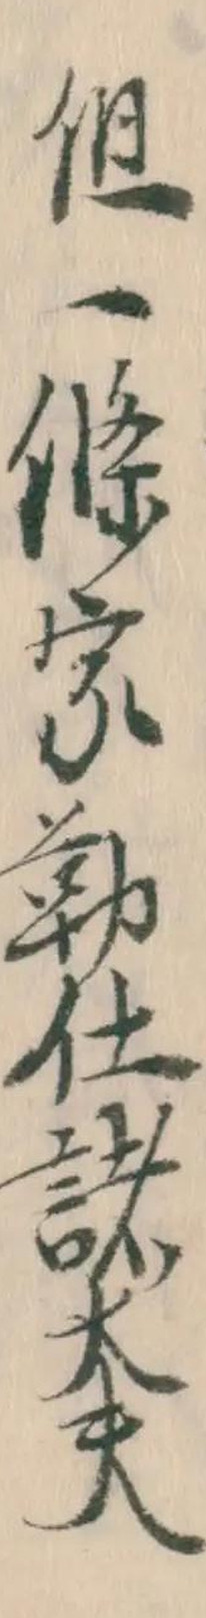但一条家勤仕諸大夫
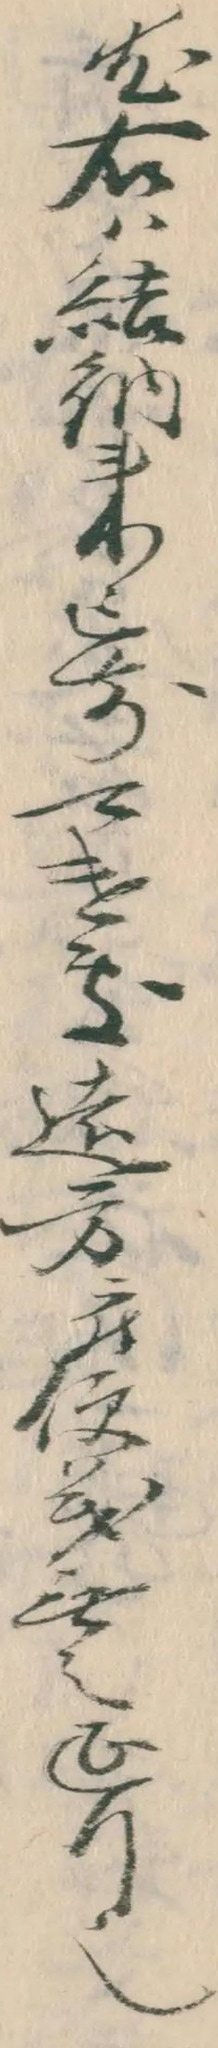尤右ハ結納来已前可遣處遠方ニ付便義無之延引也
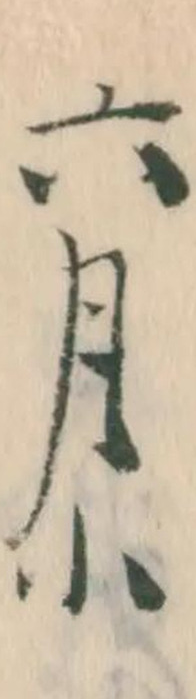六月小
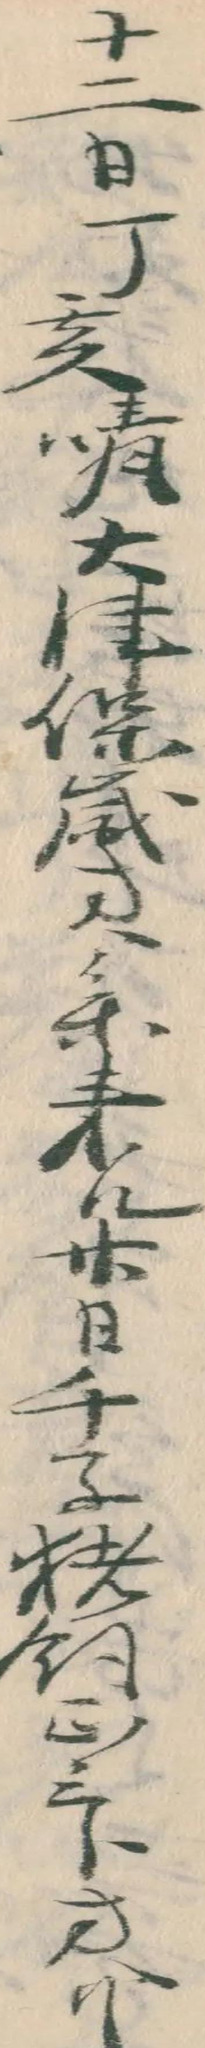十二日丁亥晴大津保威方へ参来ル廿日千子猪飼正三郎方へ引
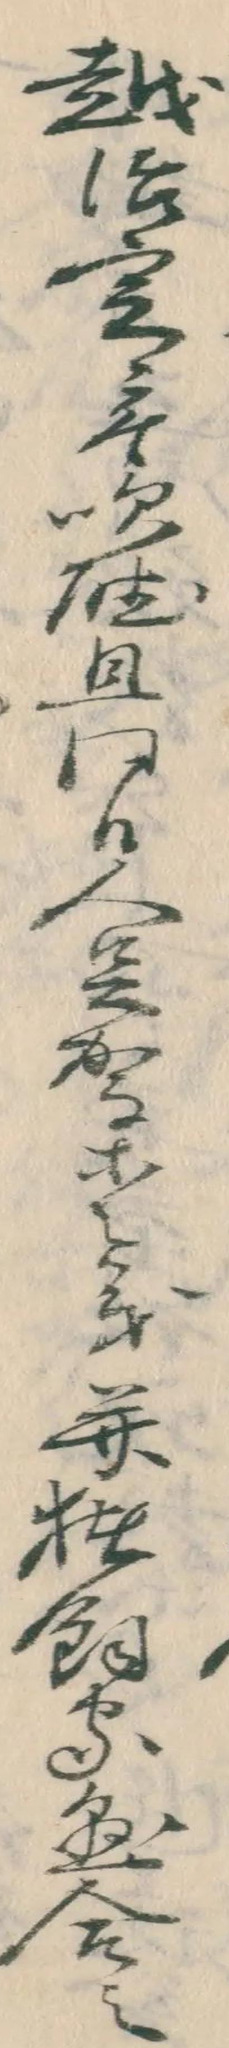越治定ニ付吹聴且同日人足駕等之義并猪飼家熟合之
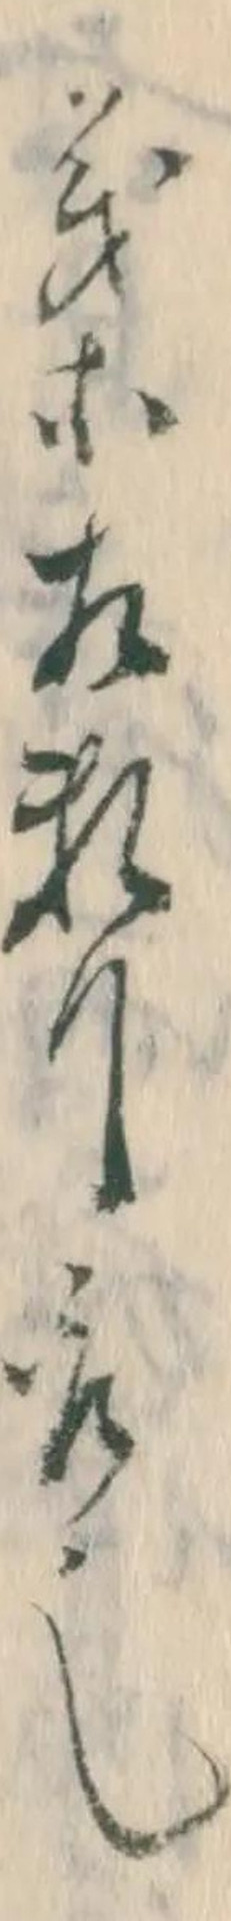義等相頼引所也
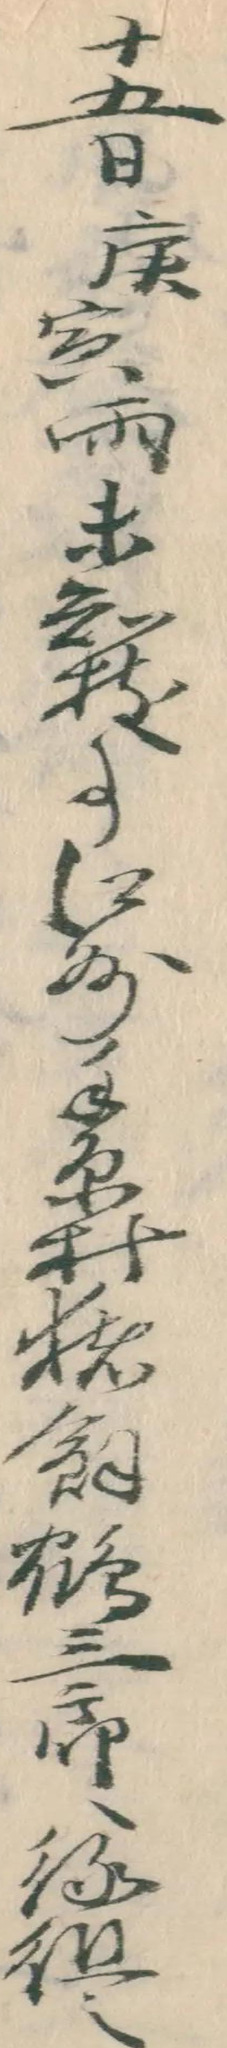十五日庚寅雨未知枝事江州手原村猪飼鶴三郎へ縁組之
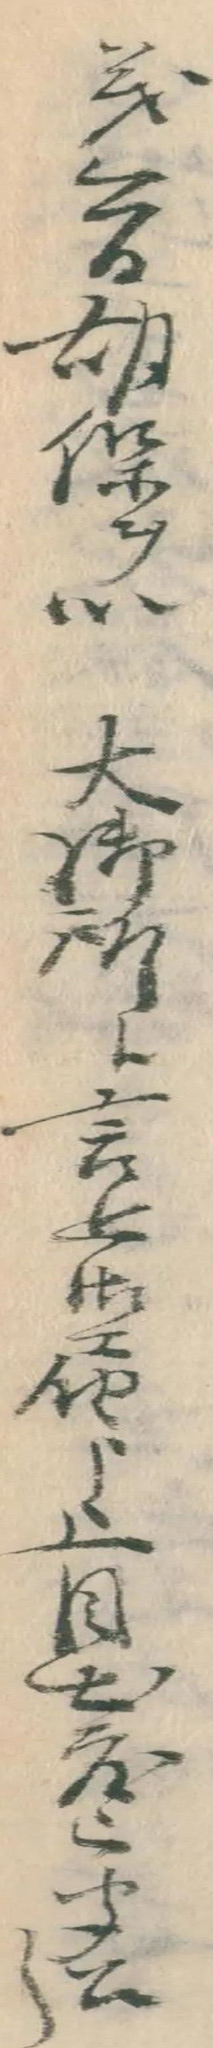義今日胡保ヲ以大御所え言上御届申上目出度被聞召了

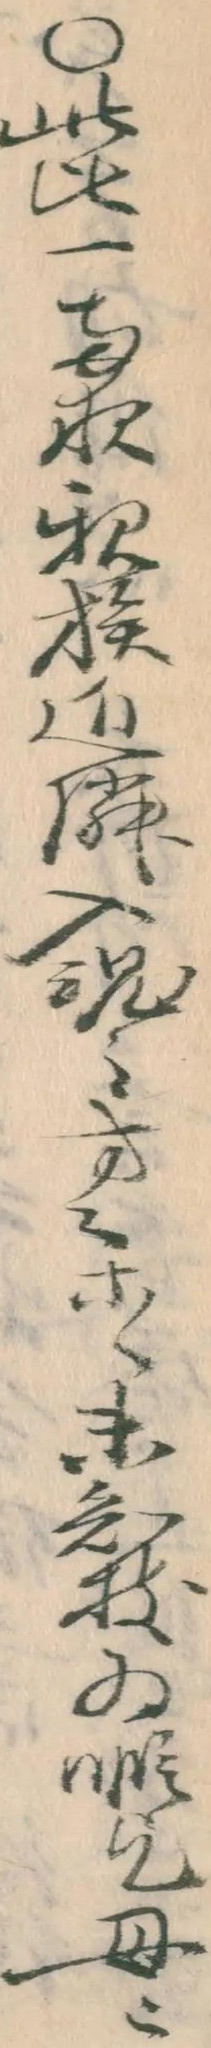〇此比一両夜親族近隣入魂之方々等へ未知枝為暇乞母ニ
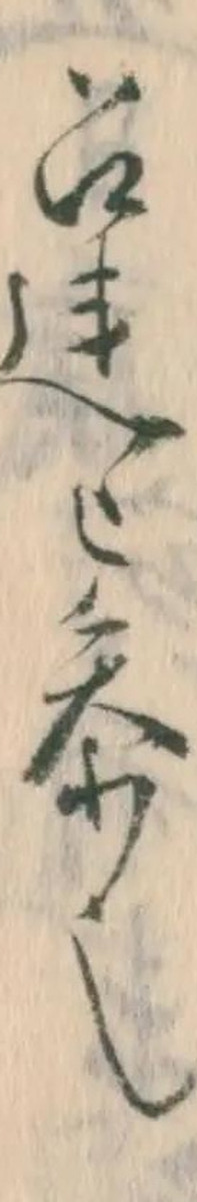召連被参也
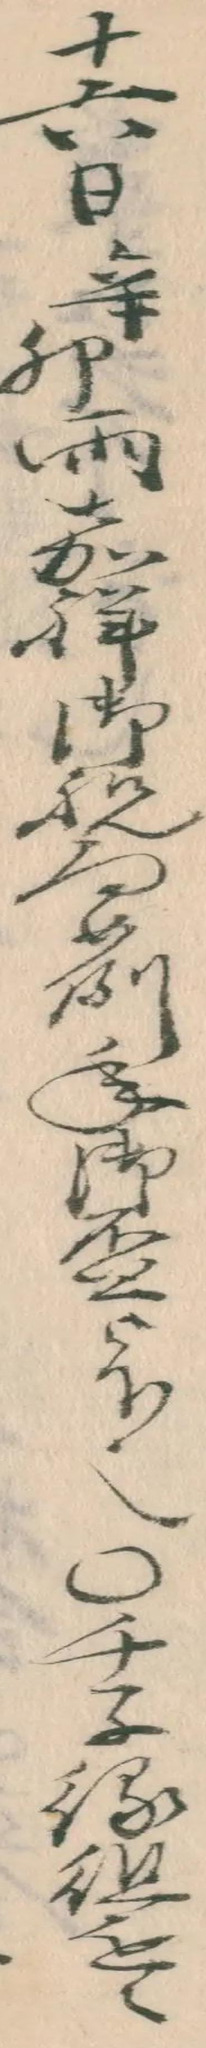十六日辛卯雨嘉祥御祝為如例年御盃被下也○千子縁組近々
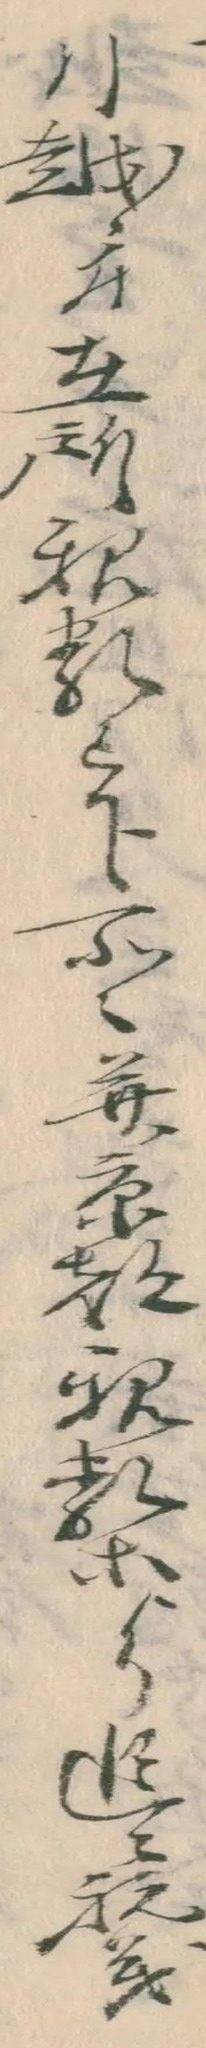引越ニ付在所親類已下所々并京都親類等より追々祝義
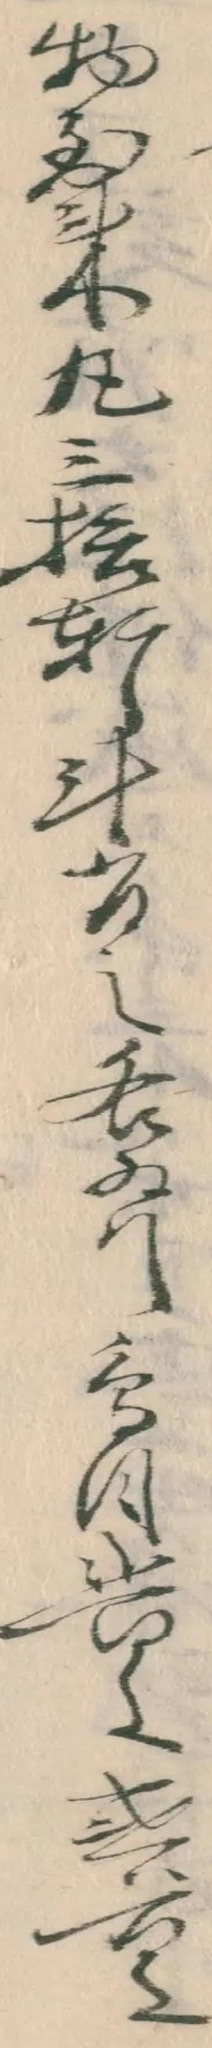物到来丸三拾軒計有之各為引鳥目弐百文或は百文
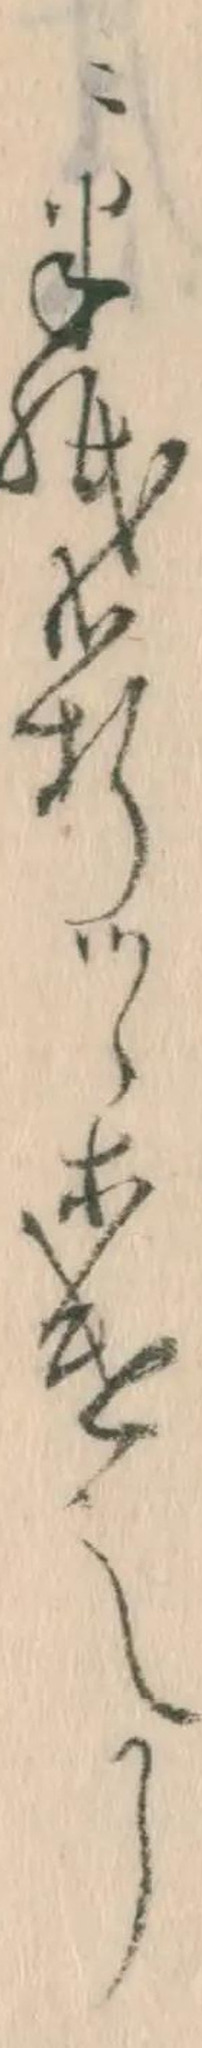二半紙弐折ツヽ等遣之了
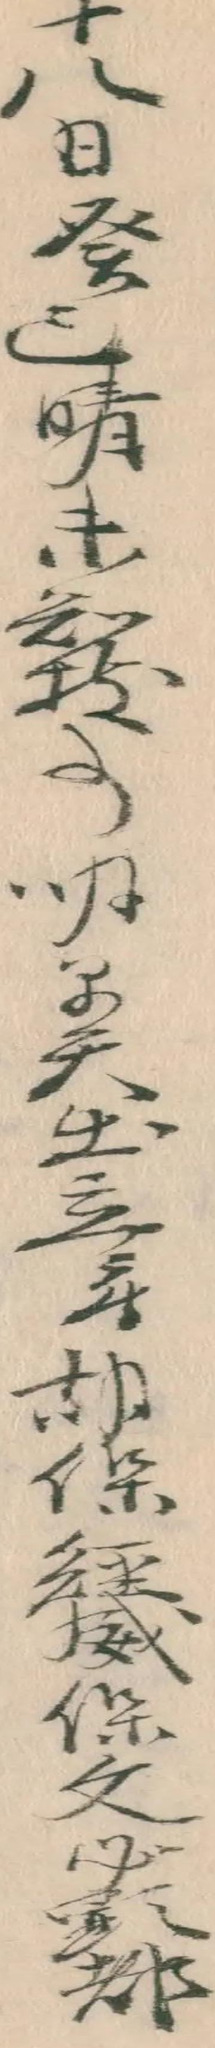十八日癸巳晴未知技事明にて出立ニ付胡保経威保文必顕都
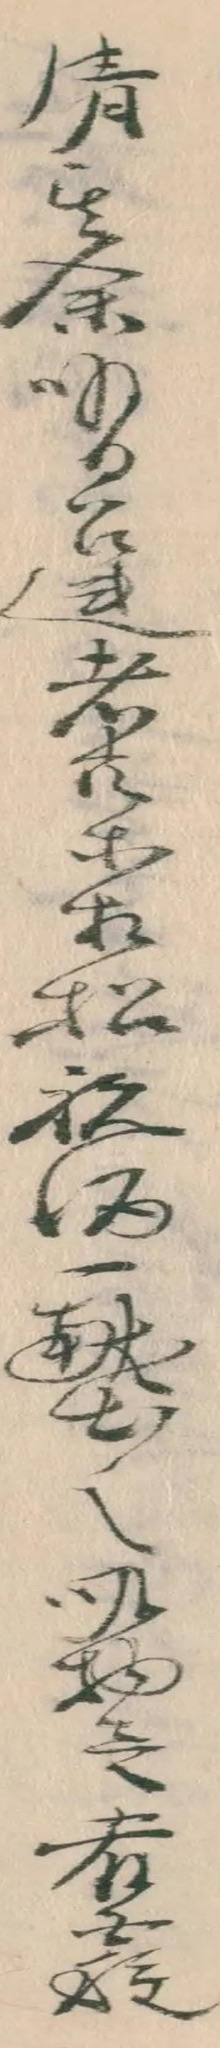清其余昨日召連者共等相招祝酒一献出也吸物壱肴五枚
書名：賀茂社記録. 第66冊
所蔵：国立国会図書館 National Diet Library, JAPAN
